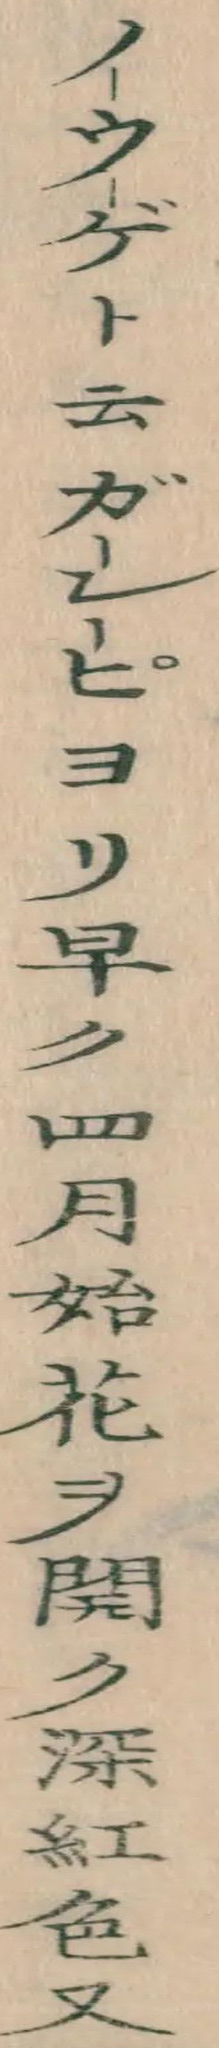ノ-ウ-ゲト云ガ-ン-ピヨリ早ク四月始花ヲ開ク深紅色又
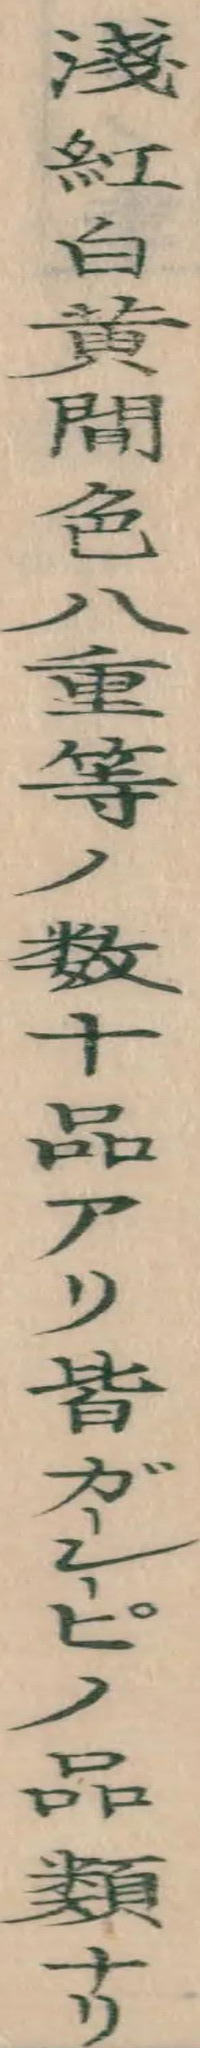浅紅白黄間色八重等ノ数十品アリ皆ガ-ン-ピノ品類ナリ
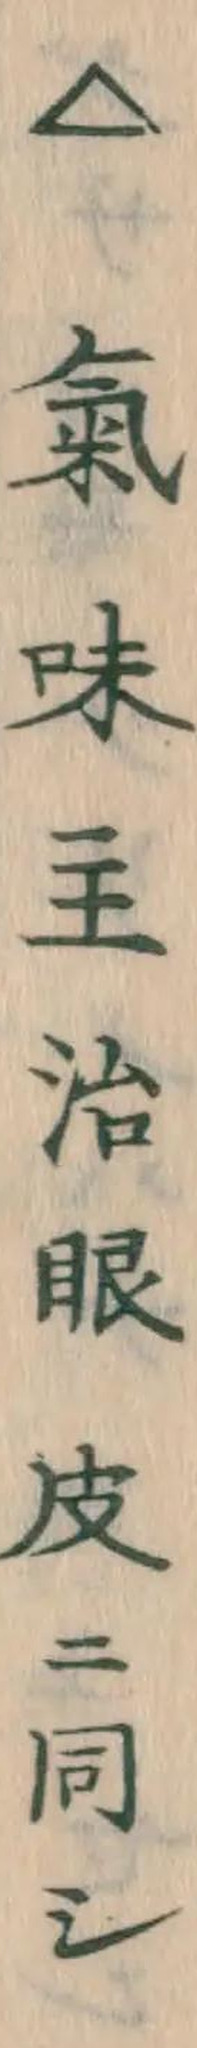△気味主治眼皮ニ同シ

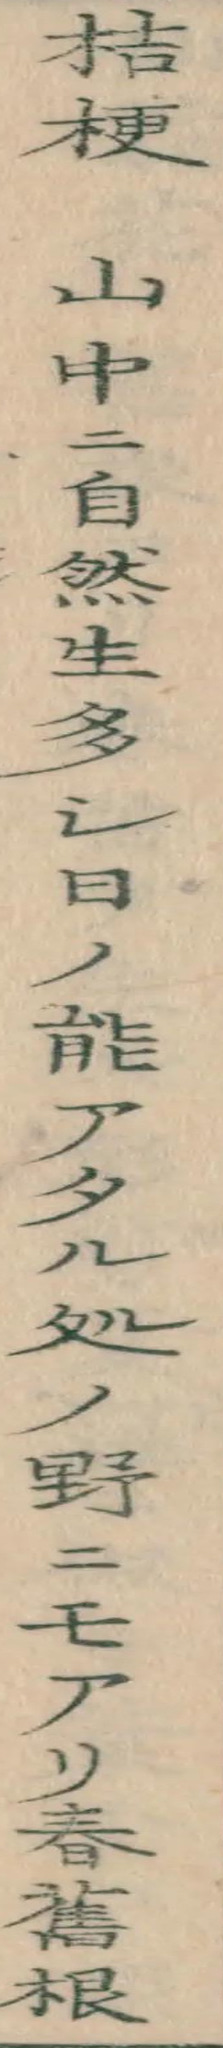桔梗山中ニ自然生多シ日ノ能アタル処ノ野ニモアリ春旧根
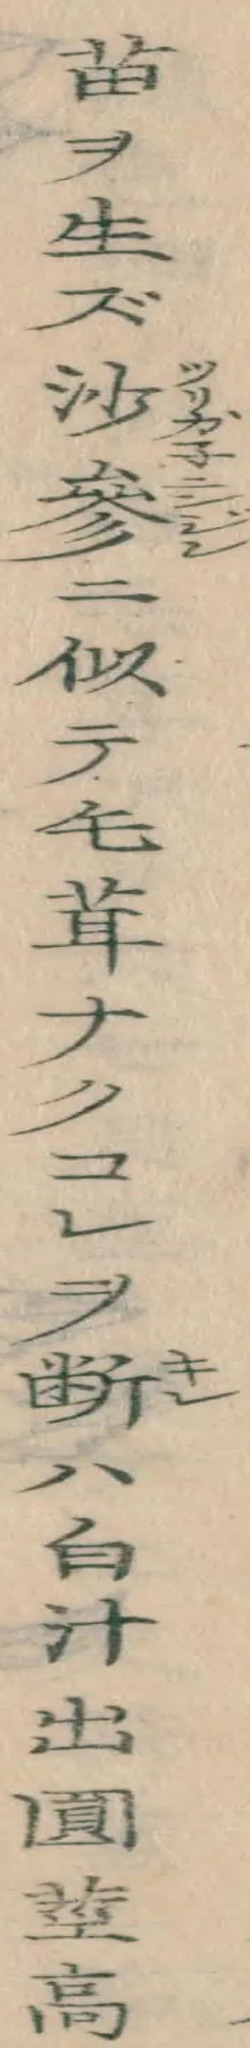苗ヲ生ズ沙参ニ似テ毛茸ナクコレヲ断ハ白汁出円茎高
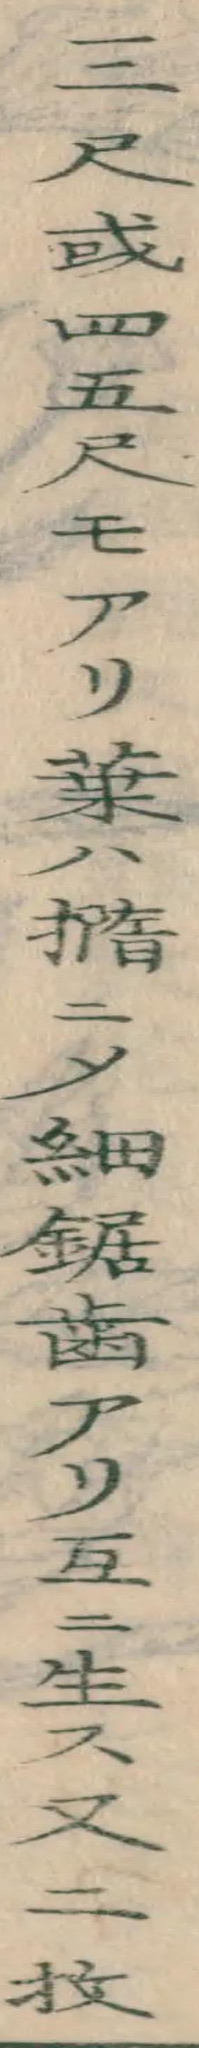三尺或四五尺モアリ葉ハ橢ニシテ細鋸歯アリ互ニ生ス又二枚
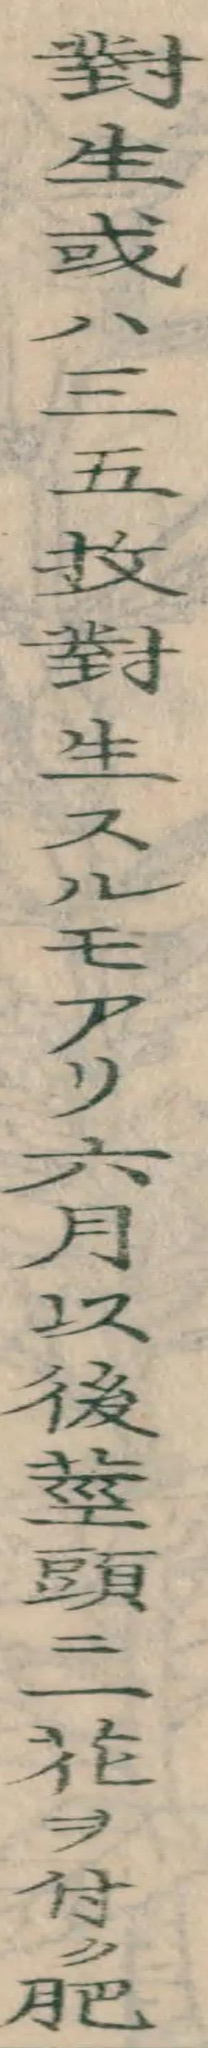対生或ハ三五枚対生スルモアリ六月以後茎頭ニ一花ヲ付肥
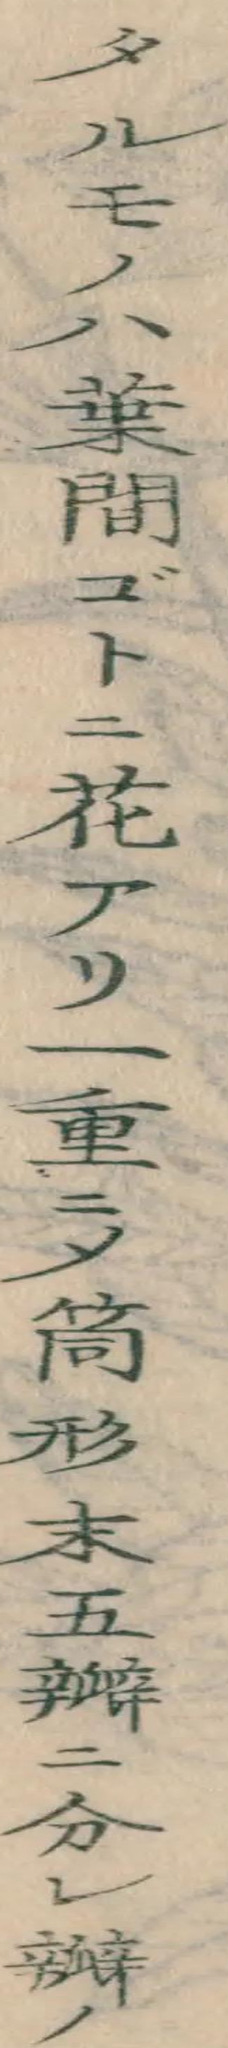タルモノハ葉間ゴトニ花アリ一重ニシテ筒形末五弁ニ分レ弁ノ
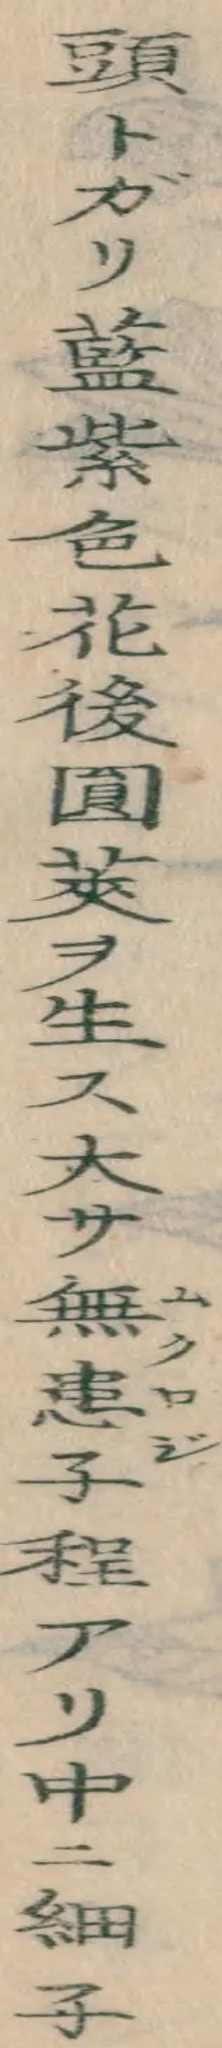頭トガリ藍紫色花後円莢ヲ生ス大サ無患子程アリ中ニ細子
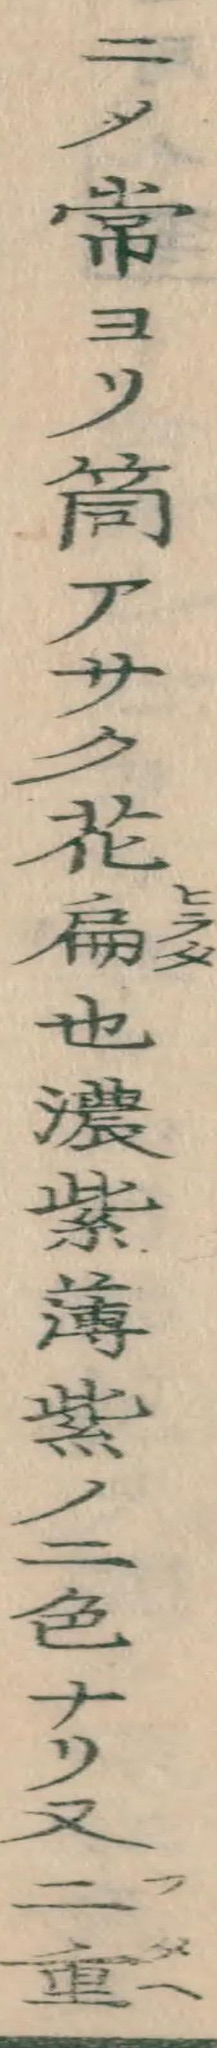ニシテ常ヨリ筒アサク花扁也濃紫薄紫ノ二色ナリ又二重
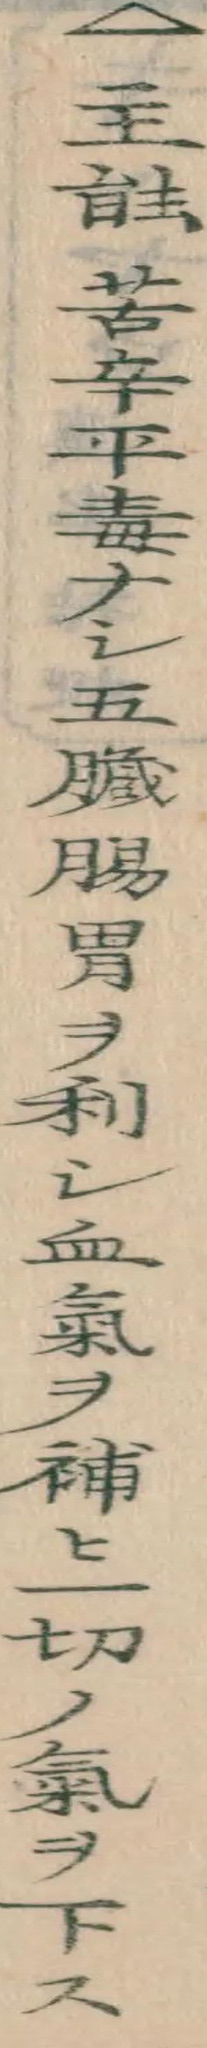△主能苦辛平毒ナシ五臓腸胃ヲ利シ血気ヲ補ヒ一切ノ気ヲ下ス

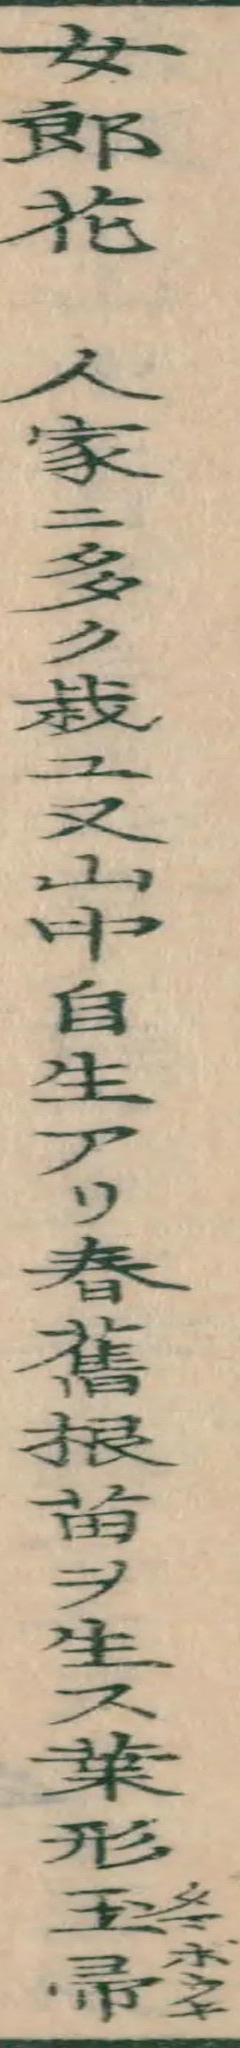女郎花人家ニ多ク栽ユ又山中自生アリ春旧根苗ヲ生ス葉形玉帚
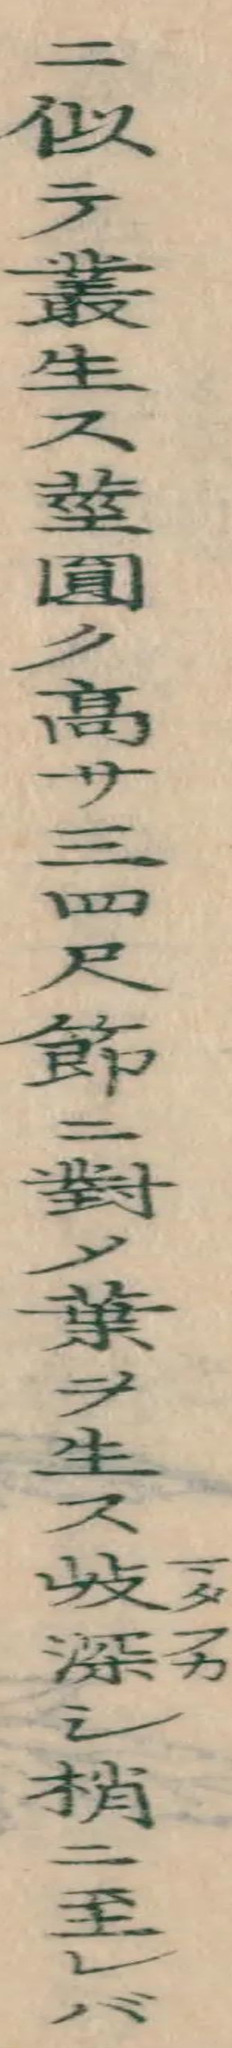ニ似テ叢生ス茎円ク高サ三四尺節ニ対シテ葉ヲ生ス岐深シ梢ニ至レバ
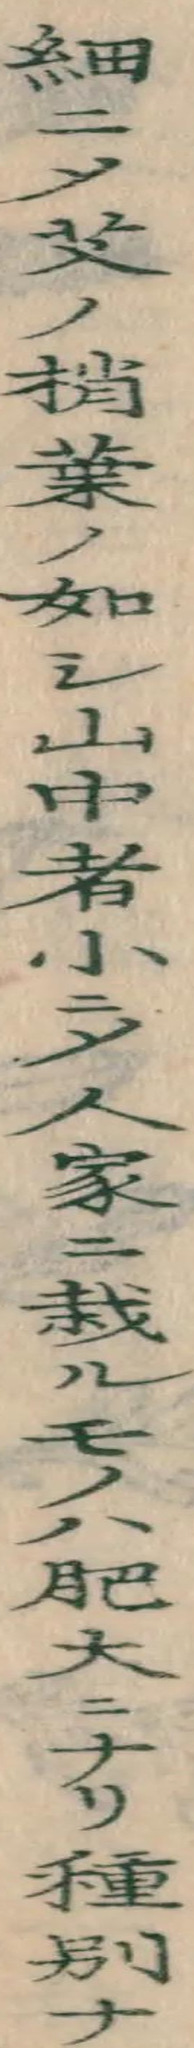細ニシテ艾ノ梢葉ノ如シ山中者小ニシテ人家ニ栽ルモノハ肥大ニナリ種別ナ
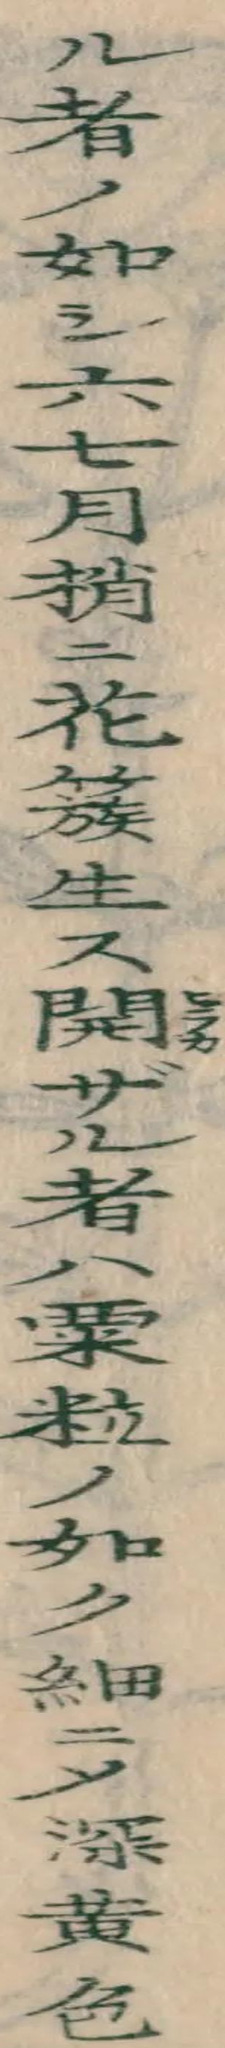ル者ノ如シ六七月梢ニ花簇生ス開ザル者ハ粟粒ノ如ク細ニシテ深黄色
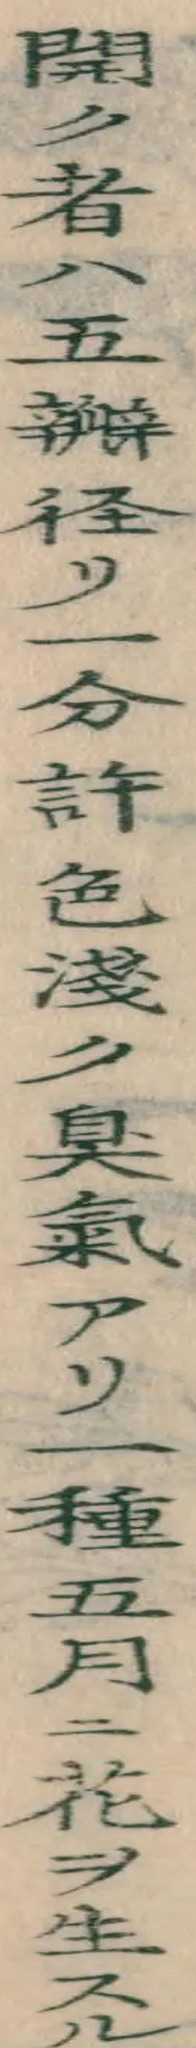開ク者ハ五弁径リ一分許色浅ク臭気アリ一種五月ニ花ヲ生スル
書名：これこれ草 2巻. [2]
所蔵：国立国会図書館 National Diet Library, JAPAN
